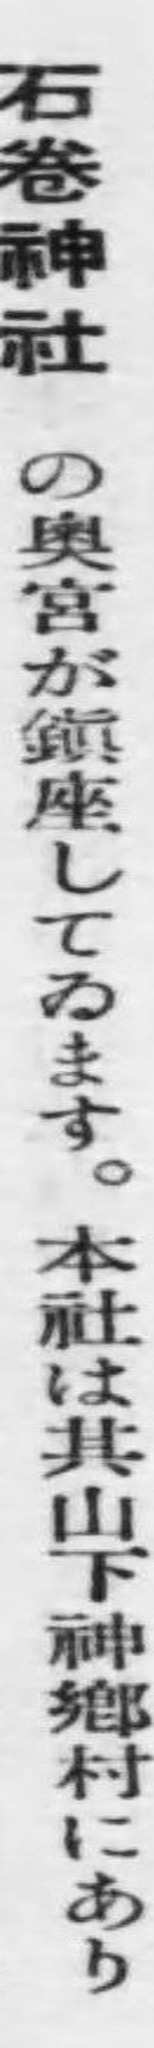石巻神社の奥宮が鎮座してゐます。本社は其山下神郷村にあり
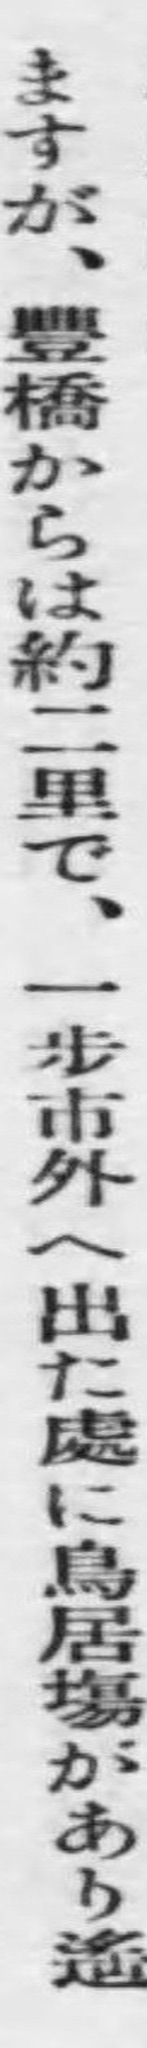ますが、豊橋からは約二里で、一歩市外へ出た処に鳥居場があり遥
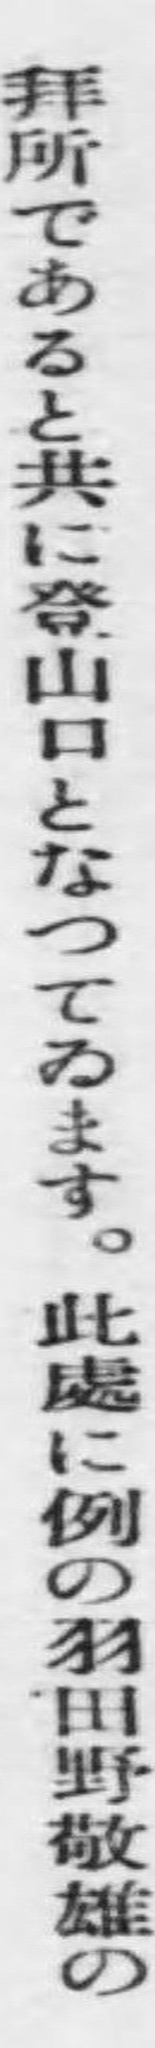拝所であると共に登山口となつてゐます。此処に例の羽田野敬雄の
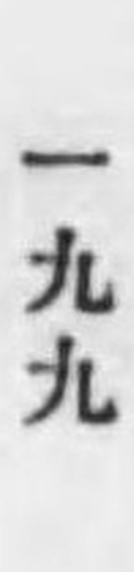一九九

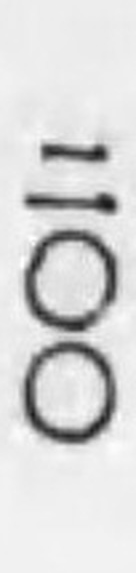二〇〇
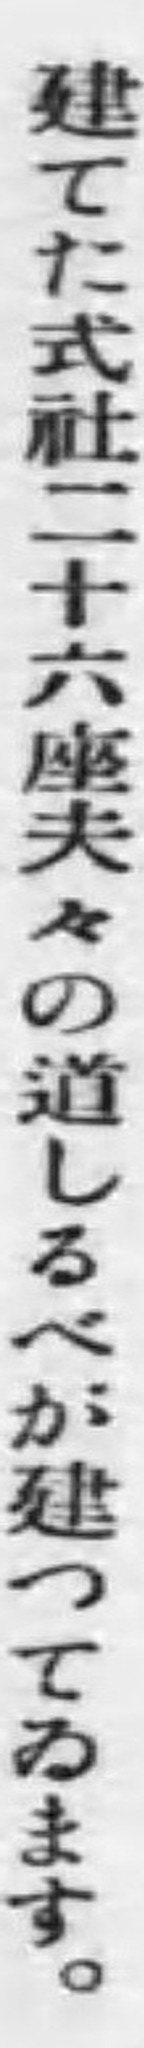建てた式社二十六座夫々の道しるべが建つてゐます。
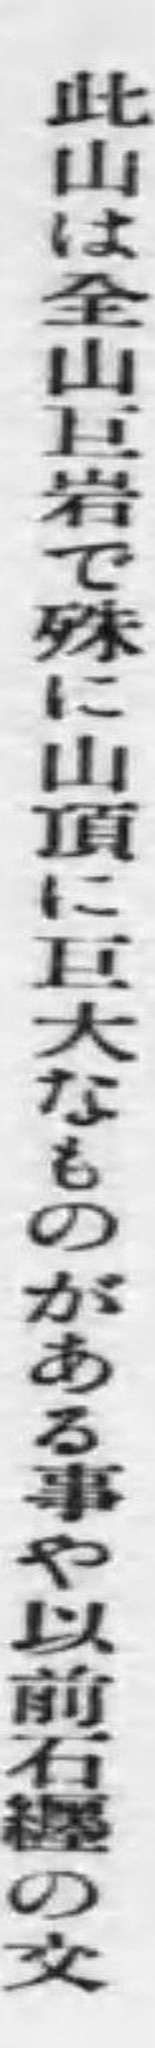此山は全山巨岩で殊に山頂に巨大なものがある事や以前石纏の文
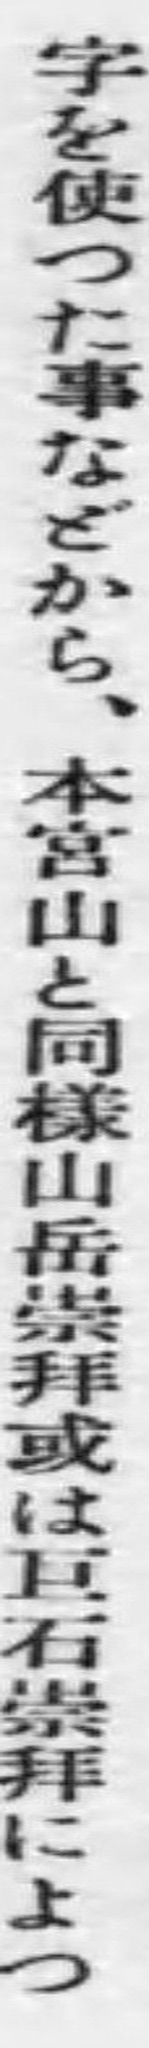字を使つた事などから、本宮山と同様山岳崇拝或は巨石崇拝によつ
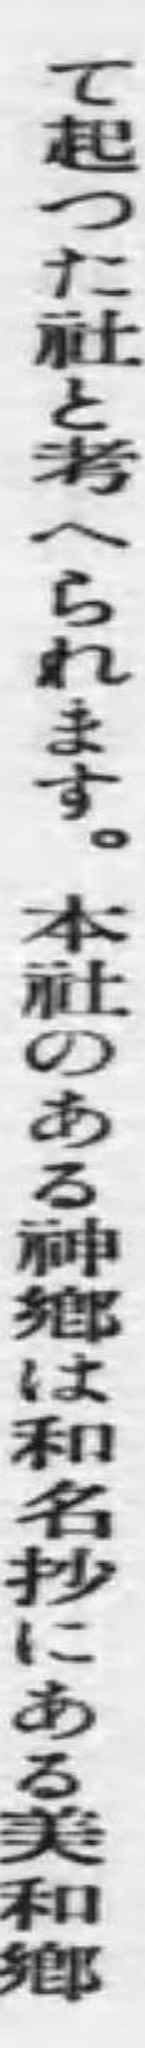て起つた社と考へられます。本社のある神郷は和名抄にある美和郷
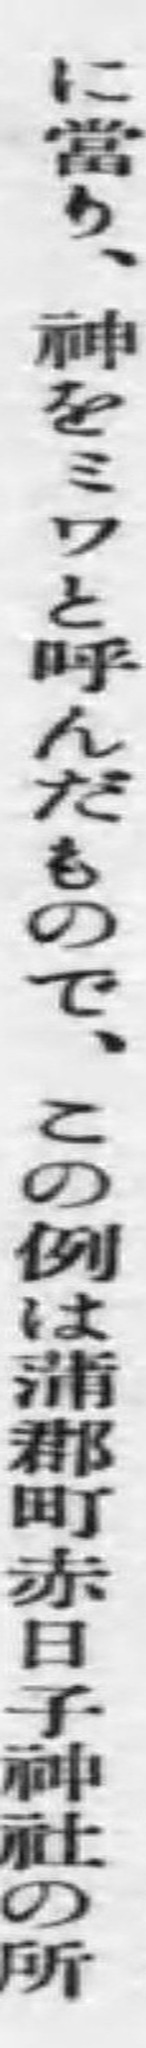に当り、神をミワと呼んだもので、この例は蒲郡町赤日子神社の所
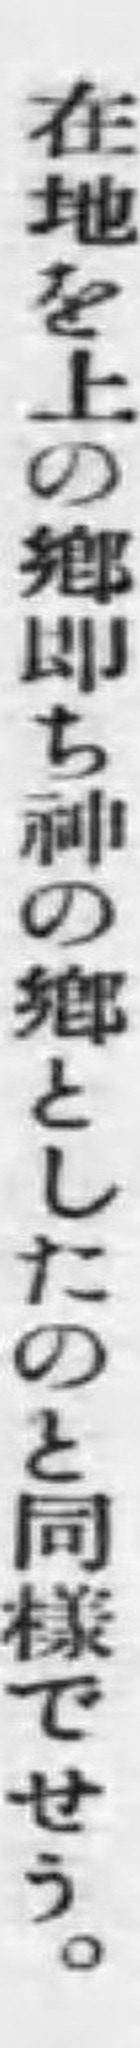在地を上の郷即ち神の郷としたのと同様でせう。
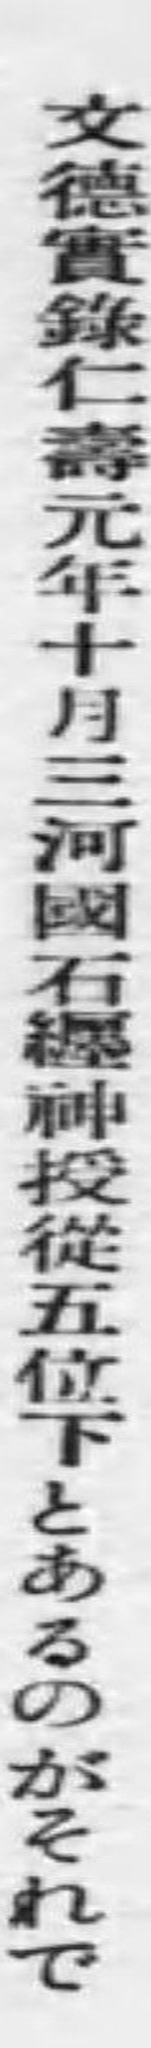文徳実録仁寿元年十月三河国石纏神授従五位下とあるのがそれで
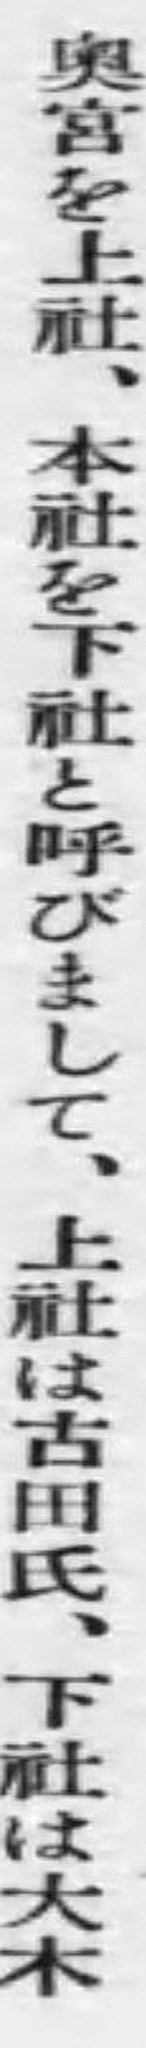奥宮を上社、本社を下社と呼びまして、上社は古田氏、下社は大木
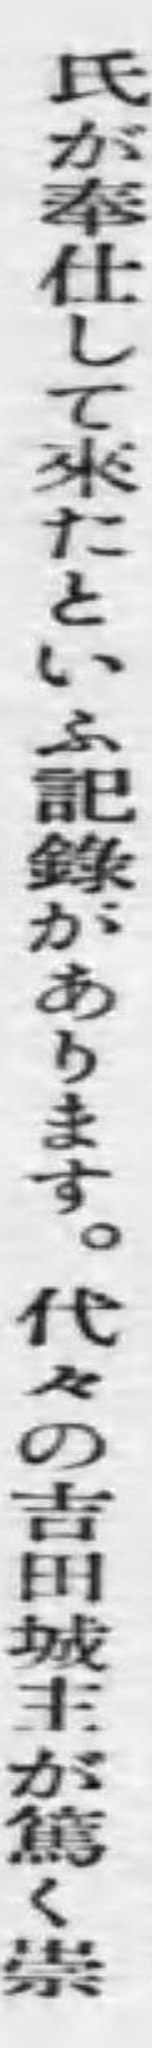氏が奉仕して来たといふ記録があります。代々の吉田城主が篤く崇
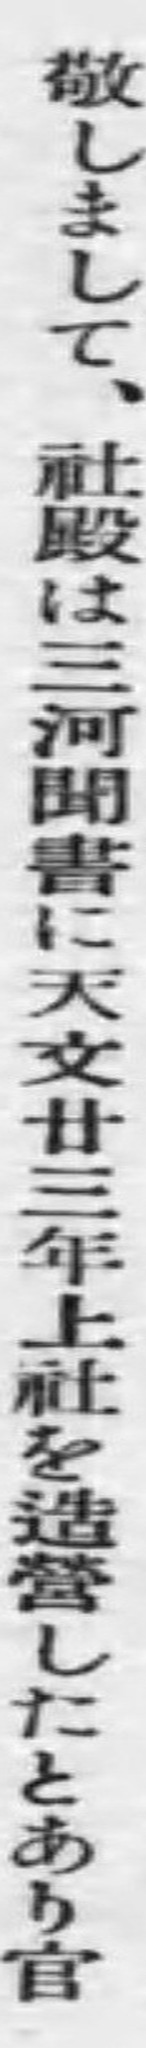敬しまして、社殿は三河聞書に天文廿三年上社を造営したとあり官
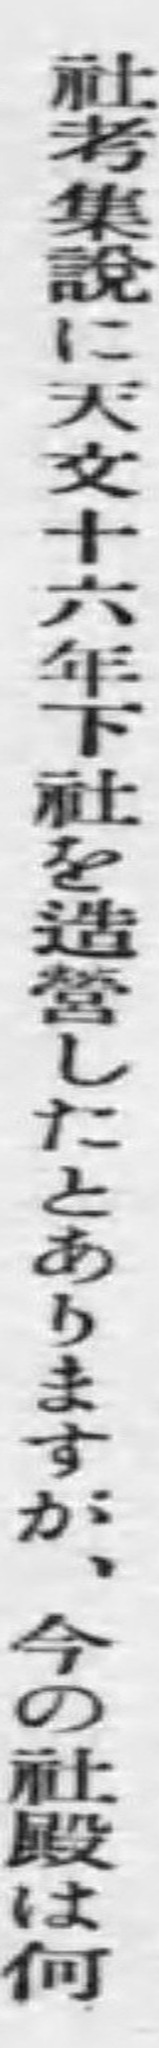社考集説に天文十六年下社を造営したとありますが、今の社殿は何
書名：東三河道中記 : 豊橋市及其附近案内
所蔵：国立国会図書館 National Diet Library, JAPAN
